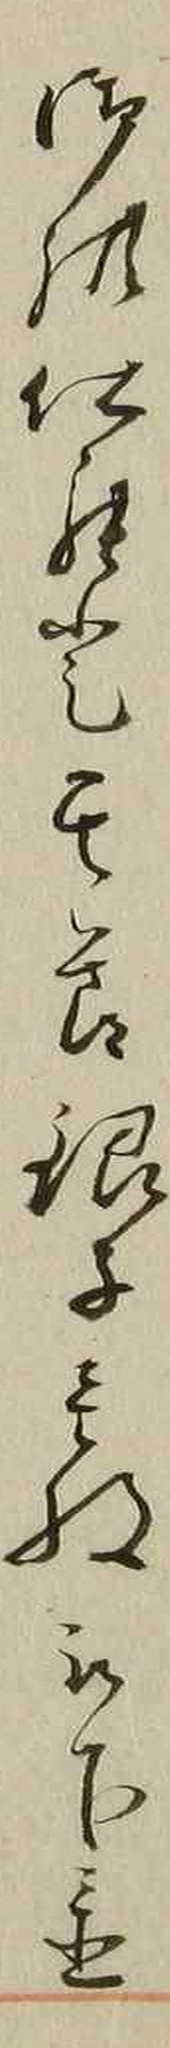御供罷登其節銀子一枚被下置
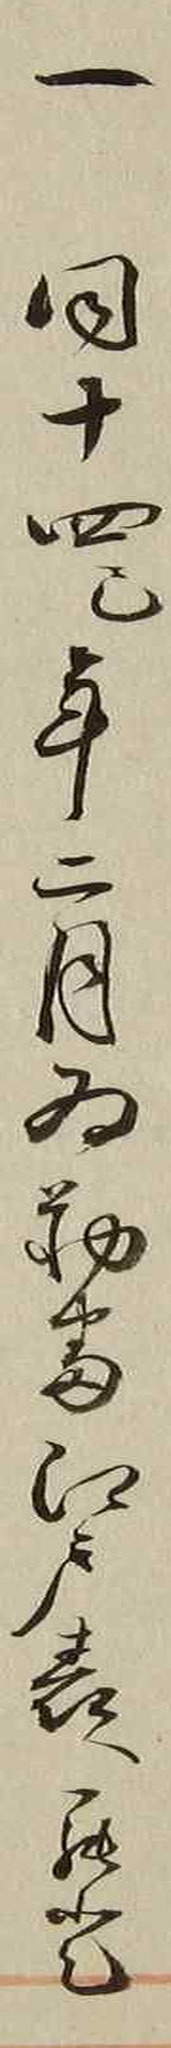一同十四巳年二月為勤番江戸表へ罷登
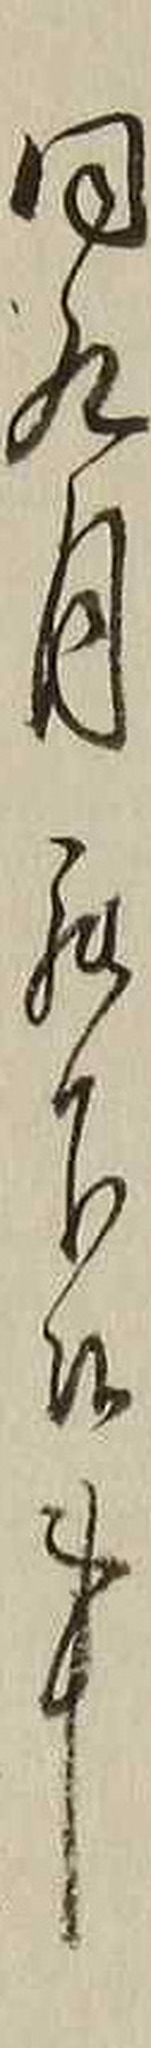同九月罷下候事
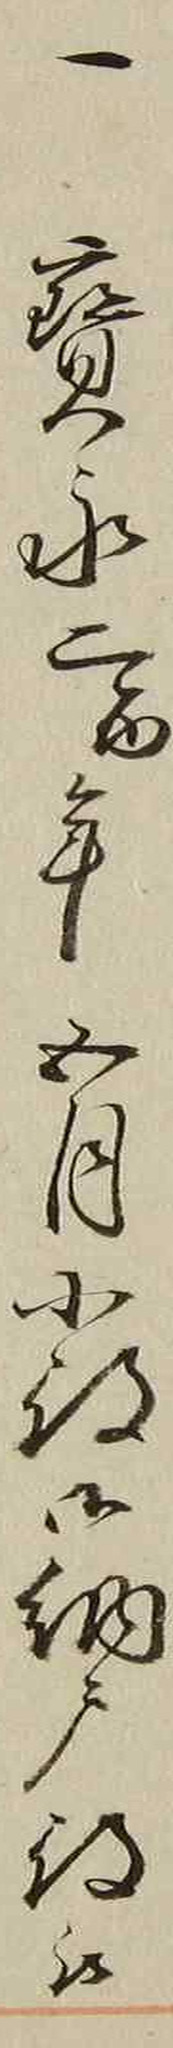一宝永二酉年五月小役御納戸役被
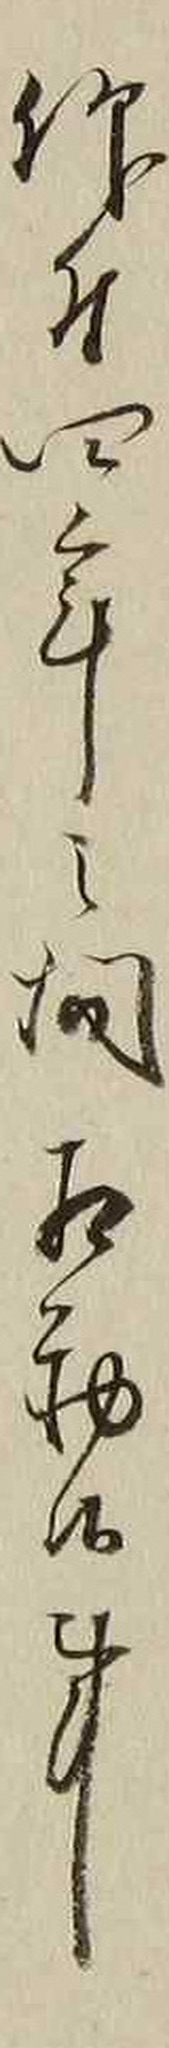仰付四年之間相勤候事
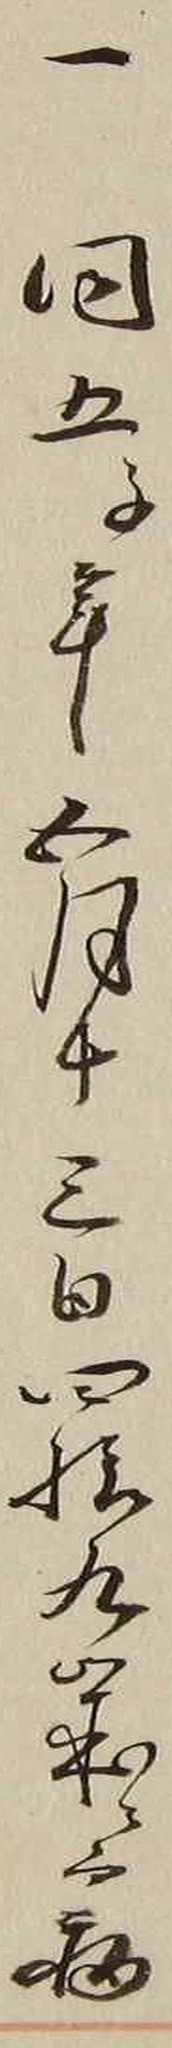一同五子年五月十三日四十九歳にて病
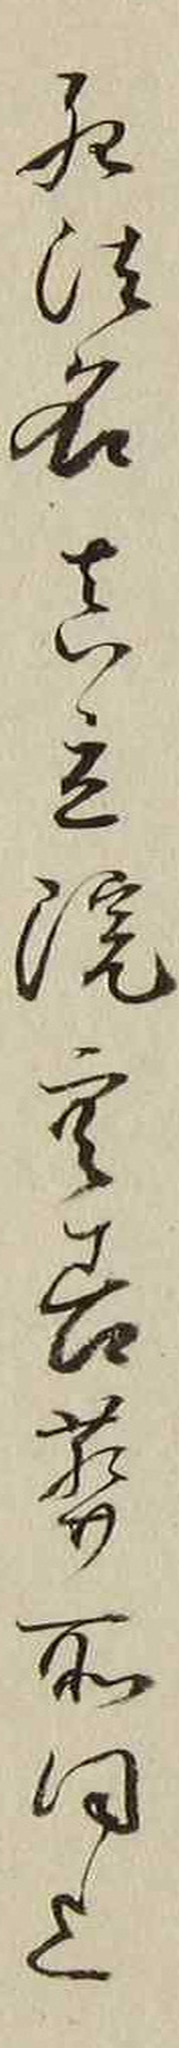死法名真立院空善葬所同上
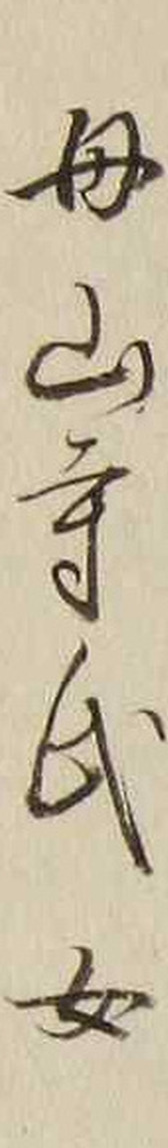母山寺氏女

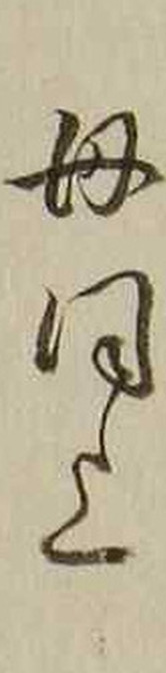母同上
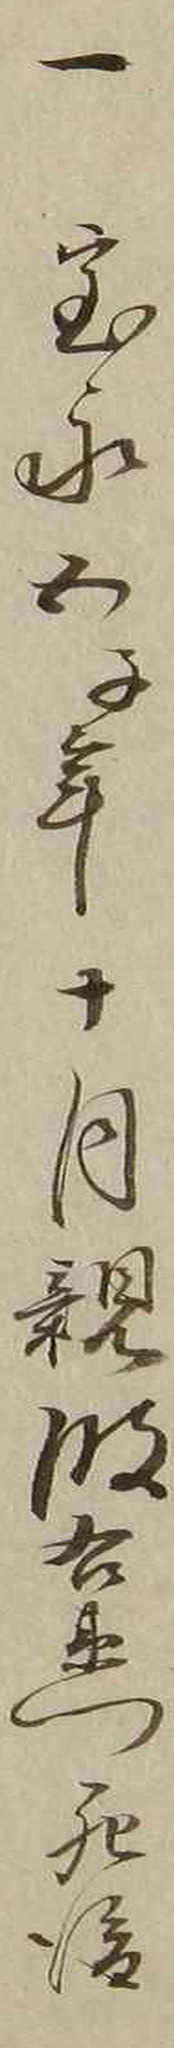一宝永五子年十月親段右衛門死後
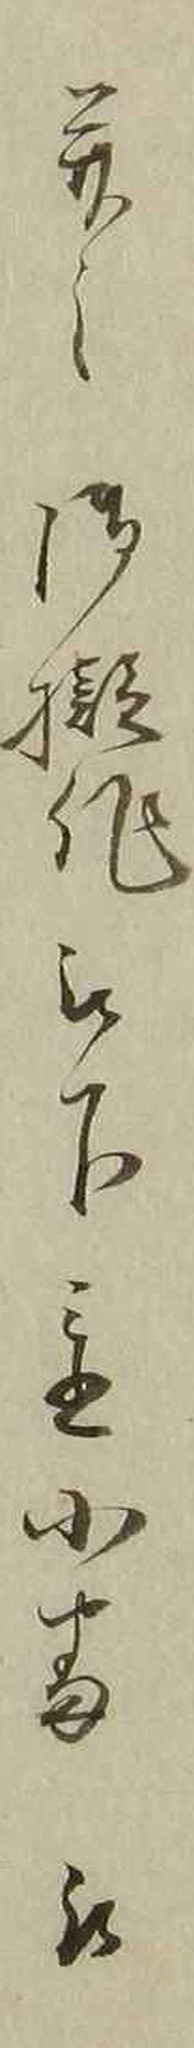并之御擬作被下置小番
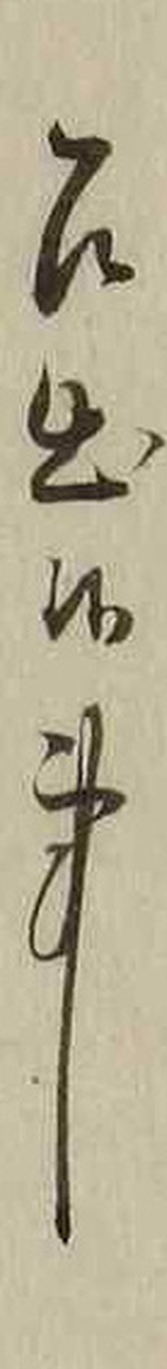召出候事
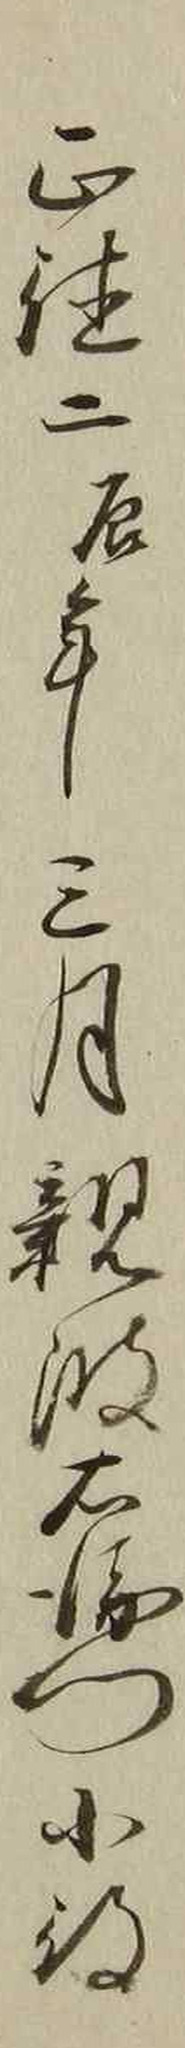一正徳二辰年三月親段右衛門小役
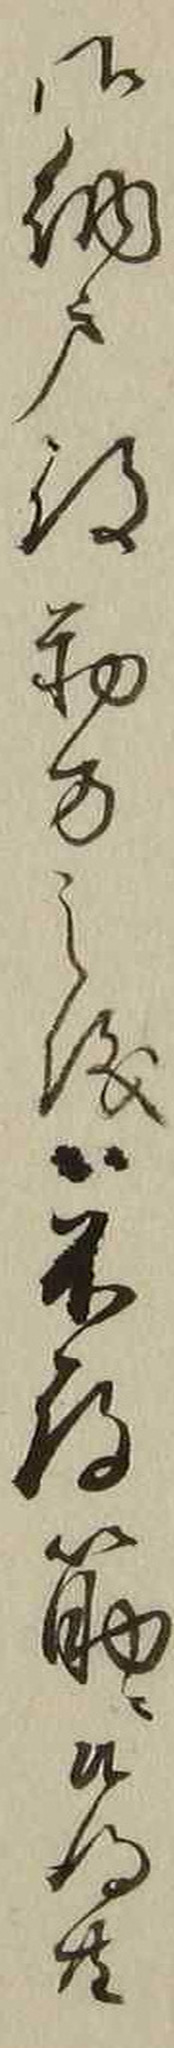御納戸役勤方之儀は不埒筋に候得共
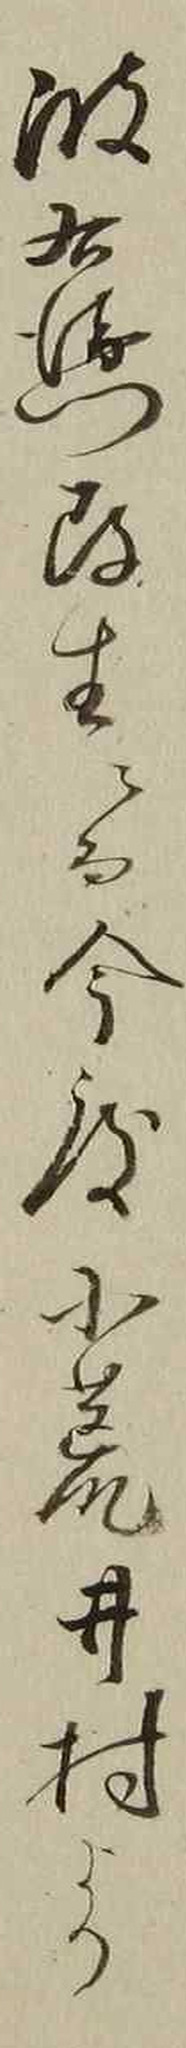段右衛門存生にて今度小荒井村より
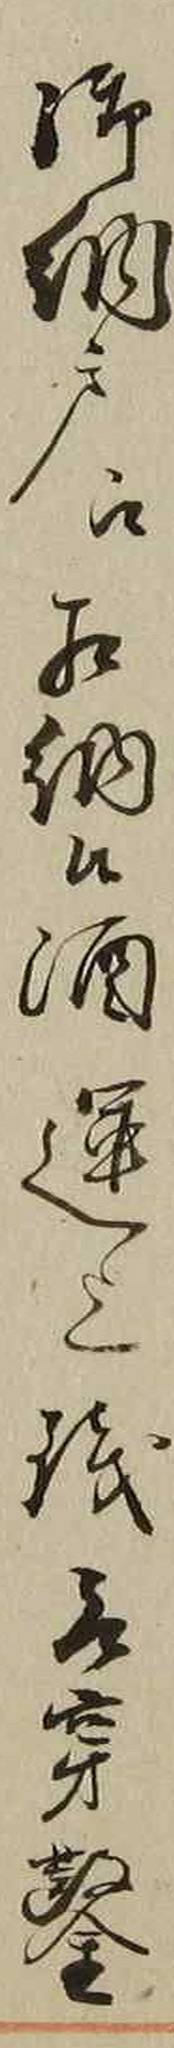御納戸へ相納候酒運上銭取穿鑿
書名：諸士系譜　巻之170　な之部12
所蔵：会津若松市立会津図書館
